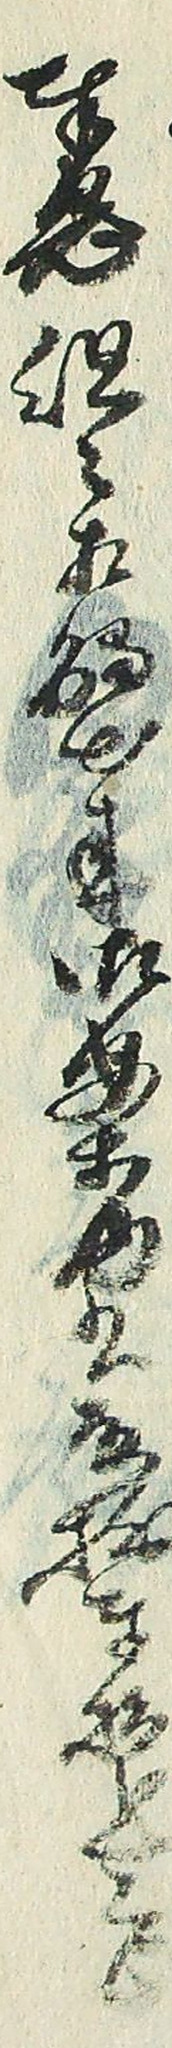奉畏組々相触出来御案内書取揃奉指上候以上

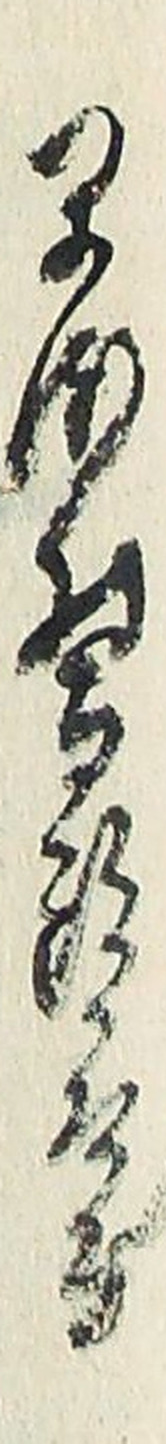早淵村与頭庄屋
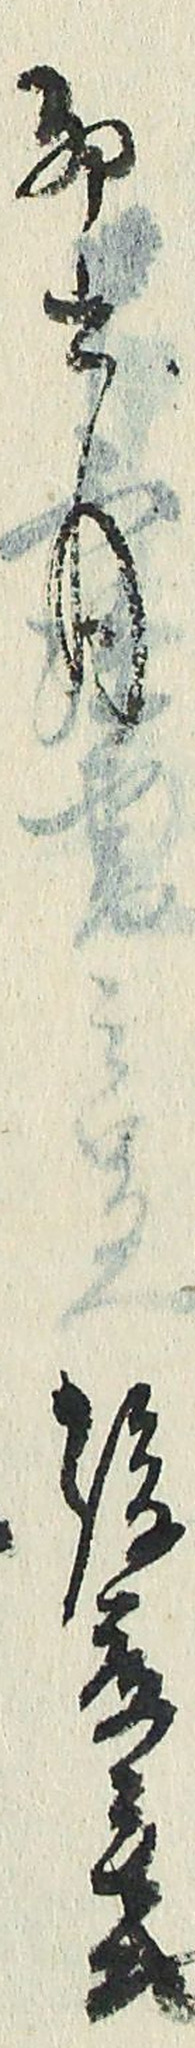卯六月後藤庄助
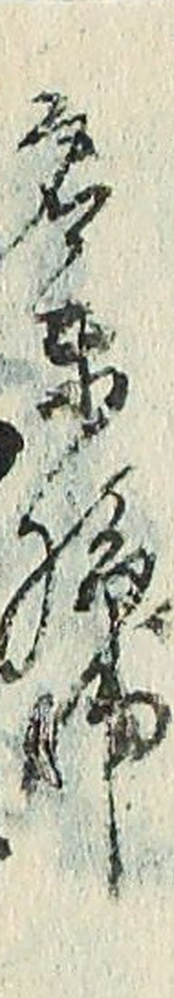名東勝浦
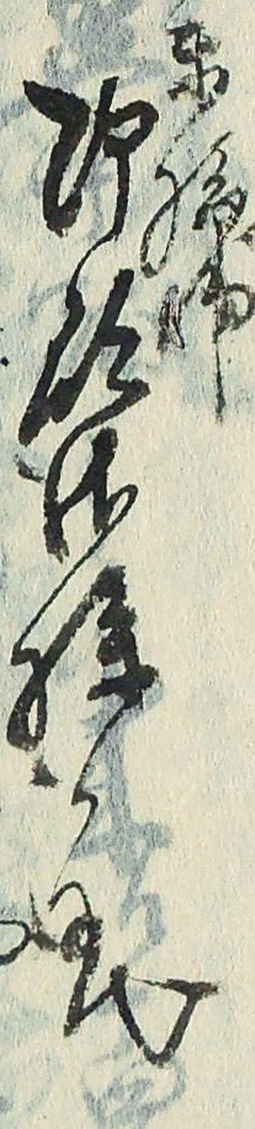御郡代様御手代
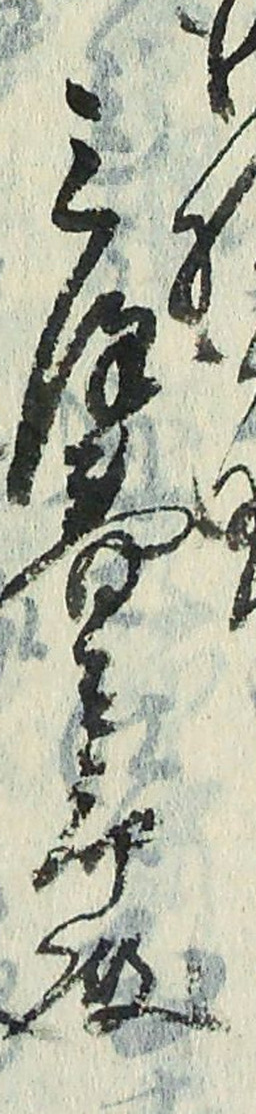三沢春太郎殿
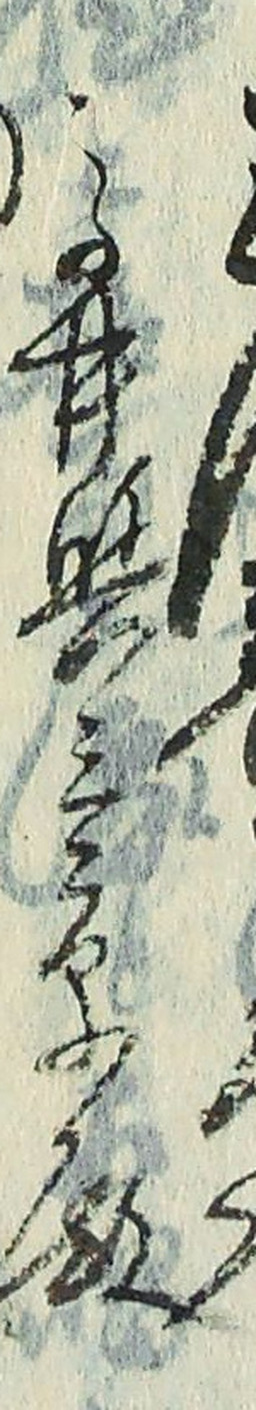高井与三兵衛殿
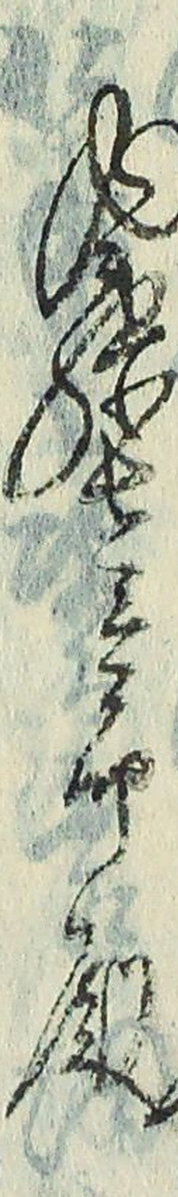内藤長三郎殿
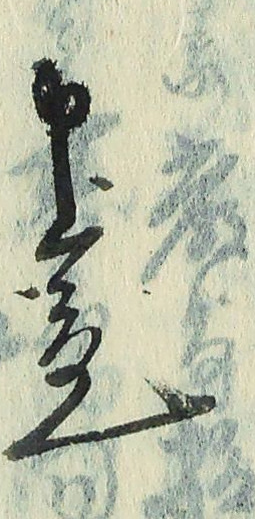申上覚
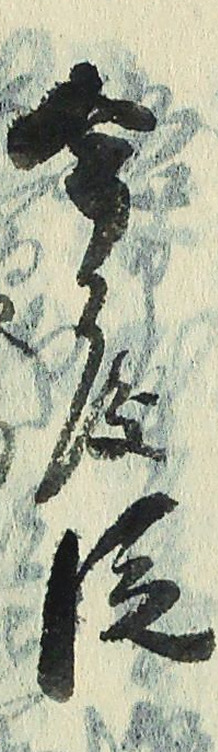今度従
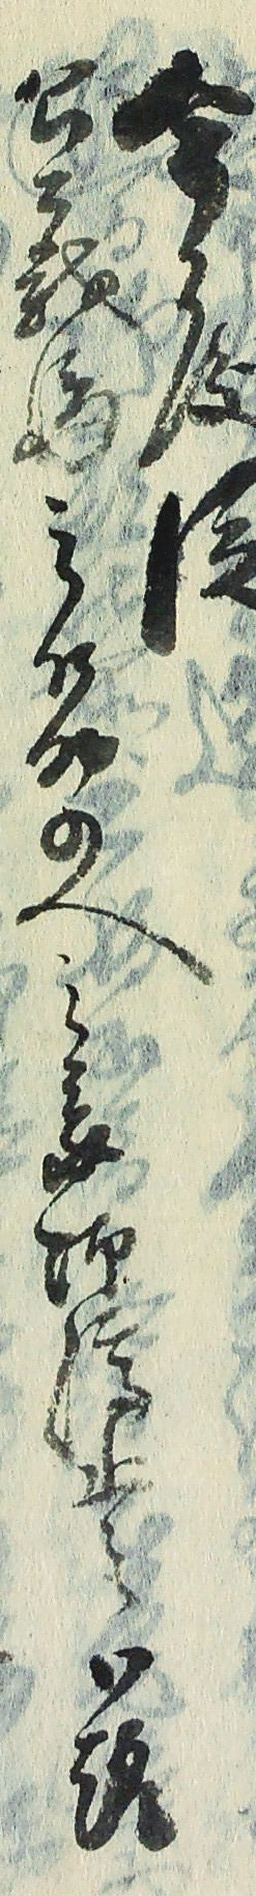公義嶋之筋の人之義御停止之御趣
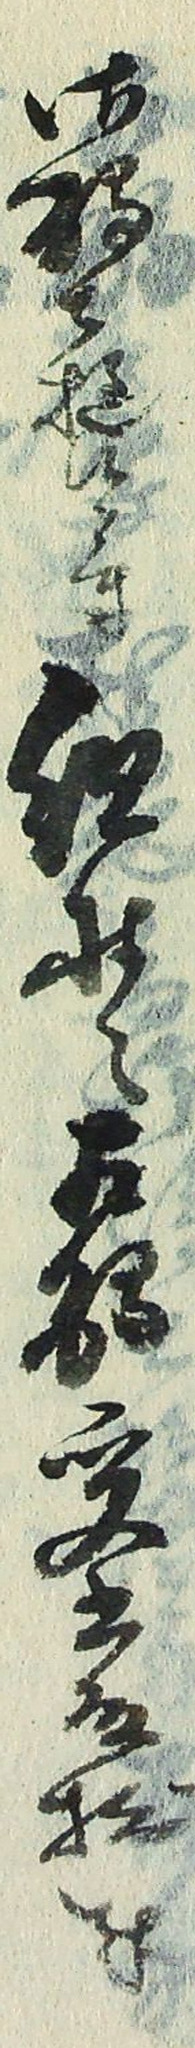御触被遊候に付組村々相触受書取揃奉
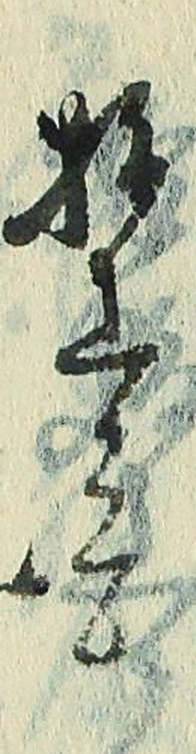指上候以上
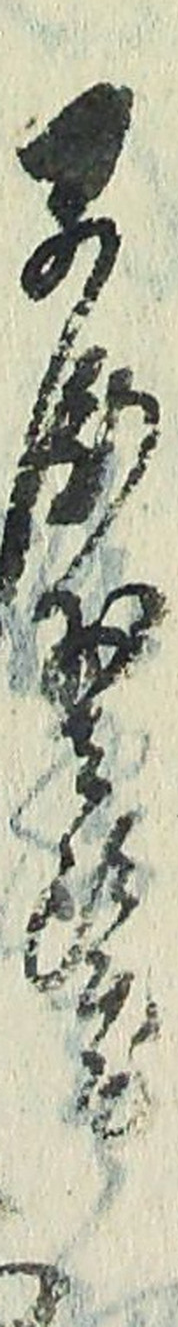早淵村与頭庄屋
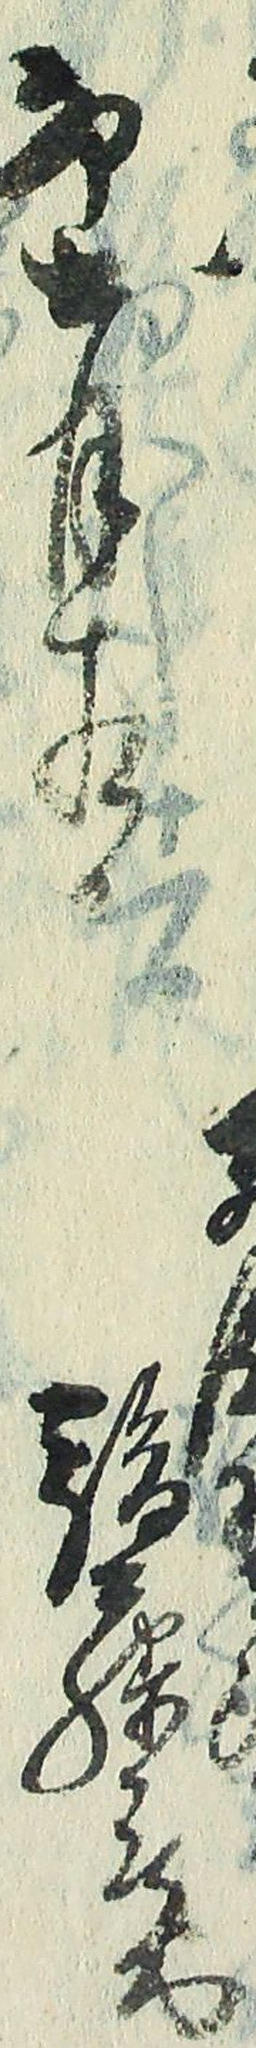卯七月十九日後藤庄助
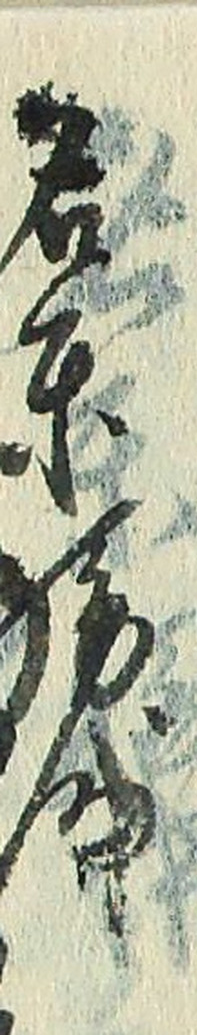名東勝浦
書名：諸御用御□受書控
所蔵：鳴門教育大学 Naruto University of Education
